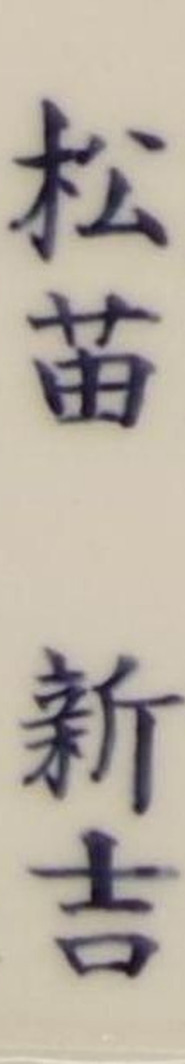松苗新吉
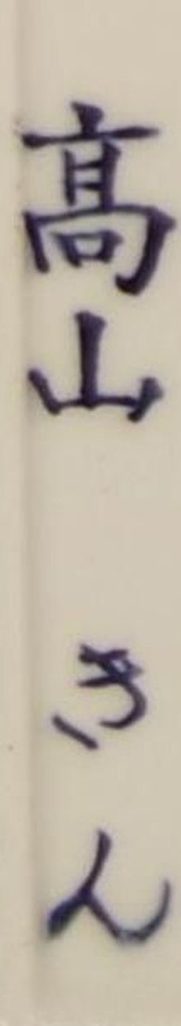高山きん

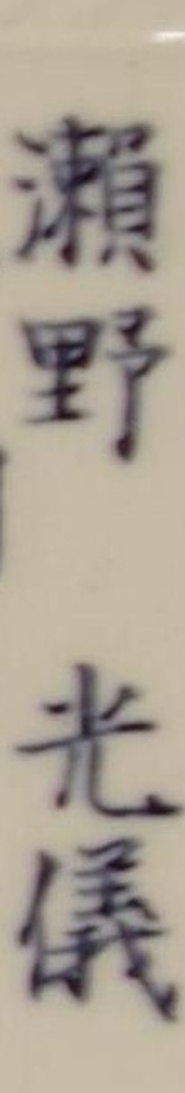瀬野光儀
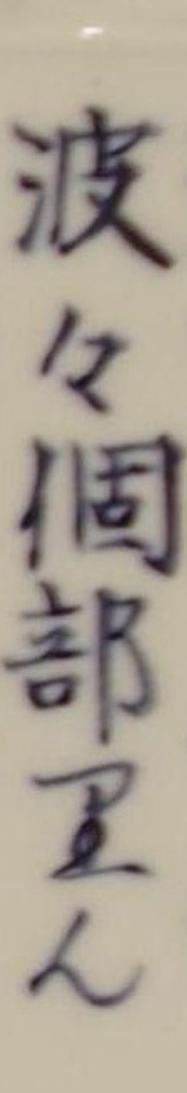波々個部りん
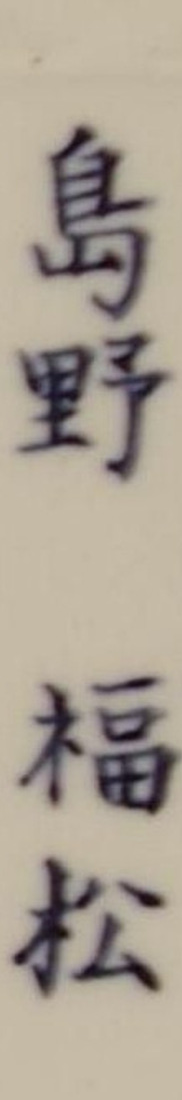島野福松
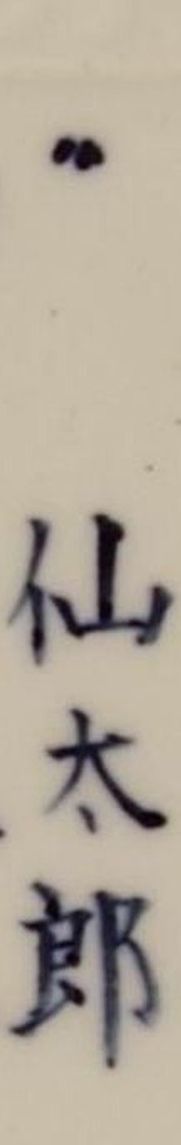仙太郎
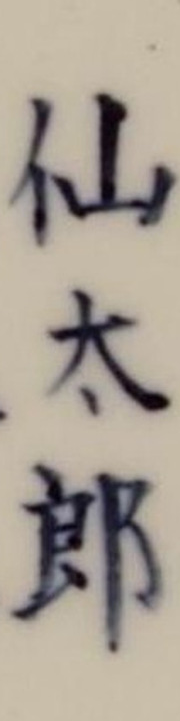仙太郎
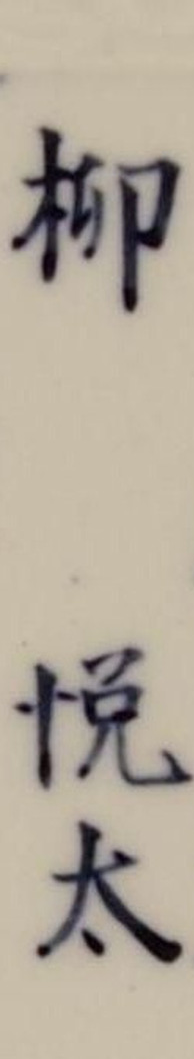柳悦太
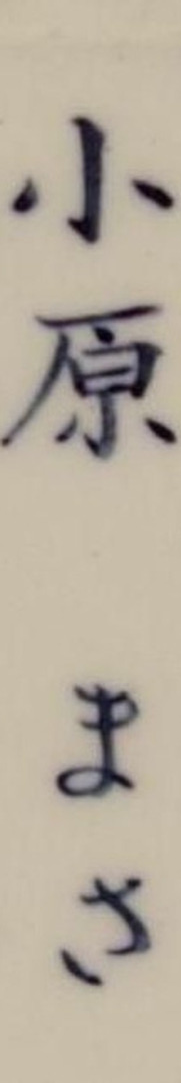小原まさ
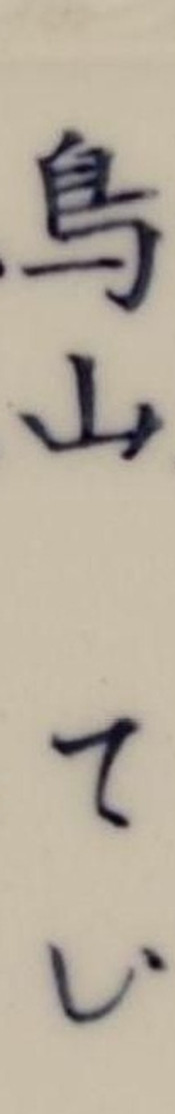鳥山てい
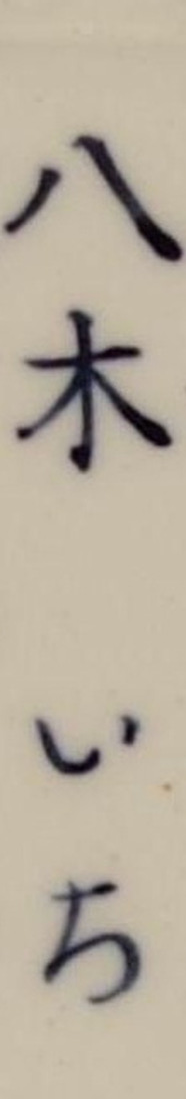八木いち
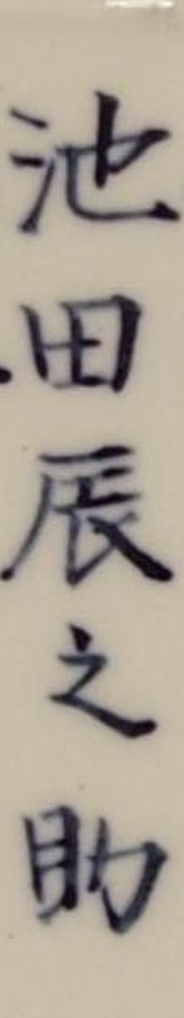池田辰之助
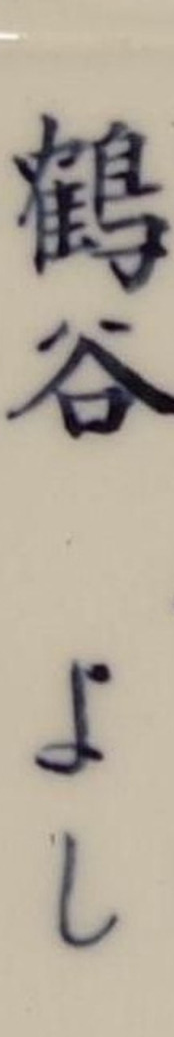鶴谷よし
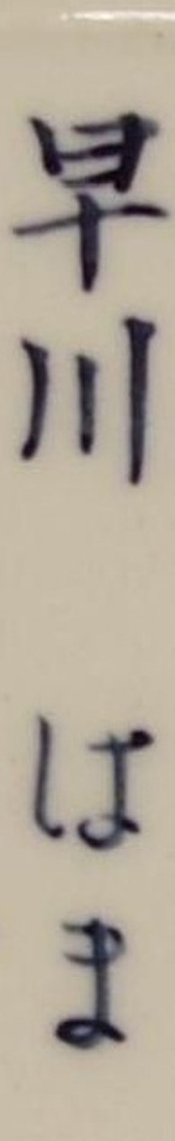早川はま
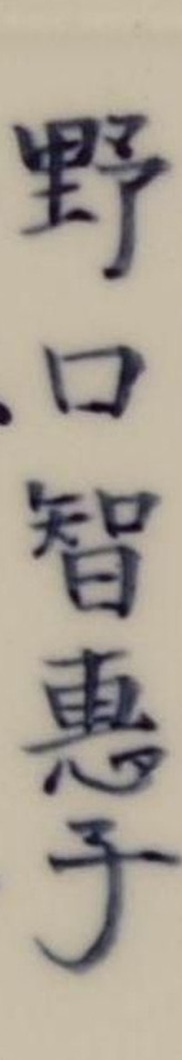野口智恵子
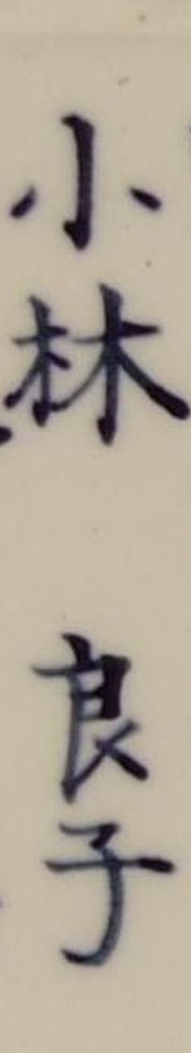小林良子
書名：M~S
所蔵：高野山金剛峯寺
